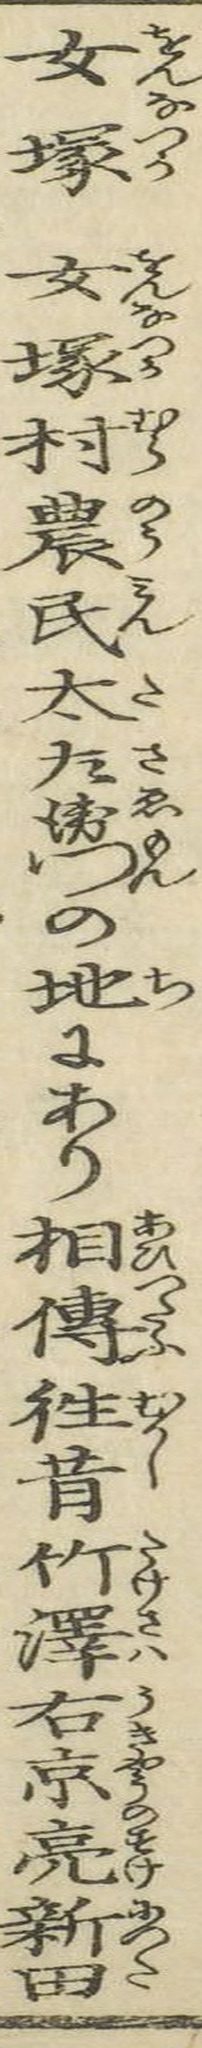女塚女塚村農民太左衛門の地にあり相傳往昔竹澤右京亮新田
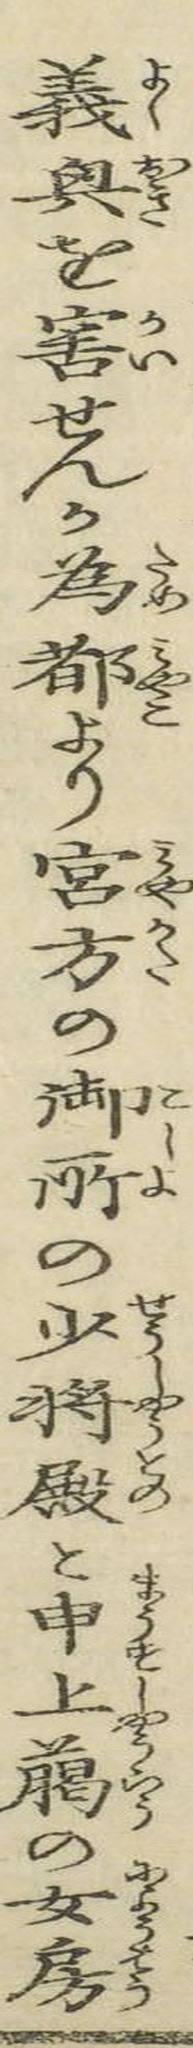義興を害せんか為都より宮方の御所の少將殿と申上﨟の女房
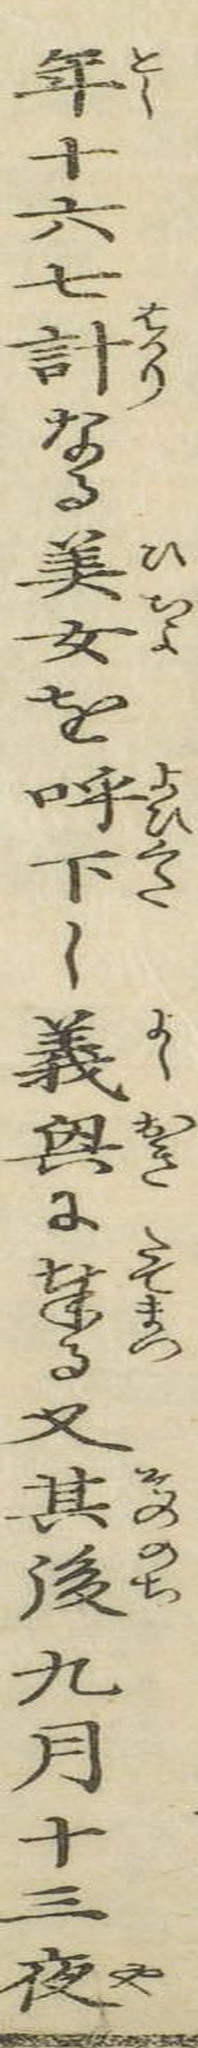年十六七計なる美女を呼下し義興に奉る又其後九月十三夜
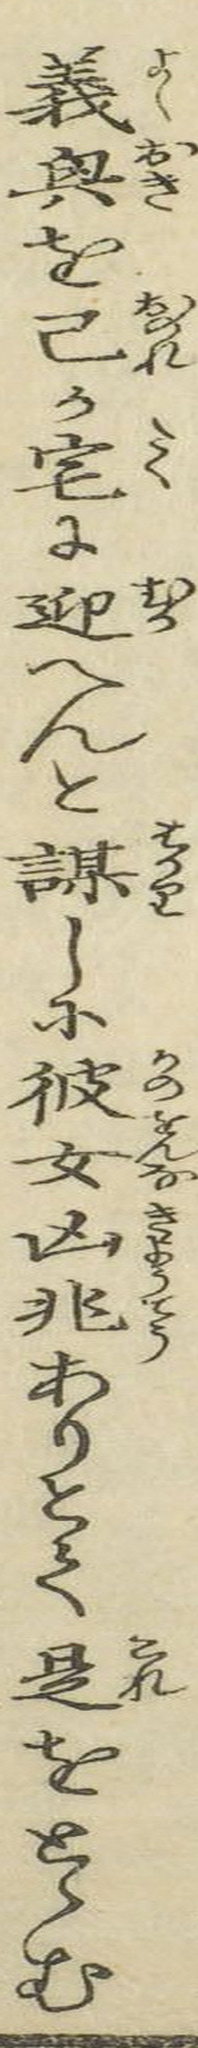義興を己か宅に迎へんと謀しに彼女凶兆ありとて是をとゝむ
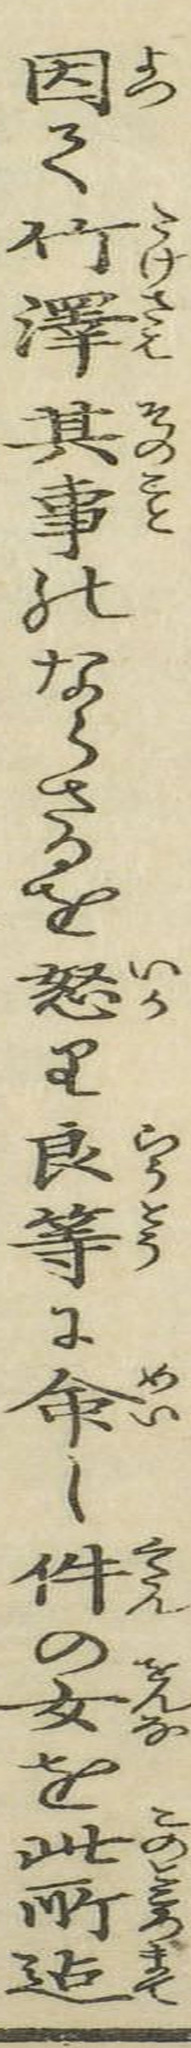因て竹澤其事のならさるを怒り良等に命し件の女を此所迠
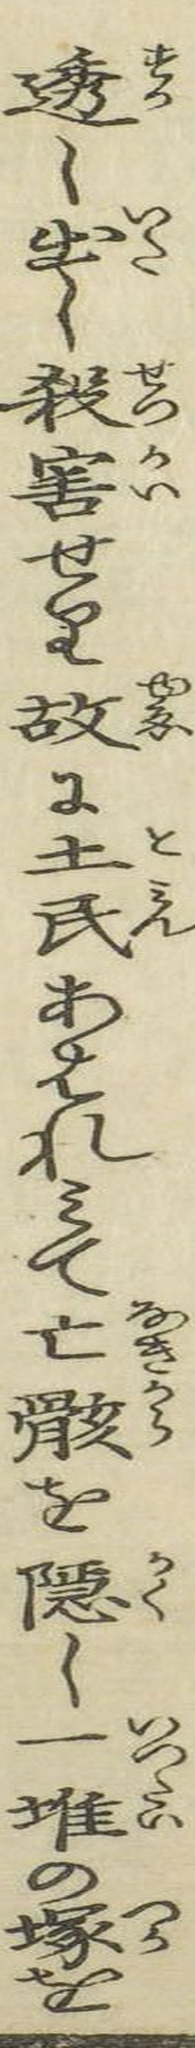透し出し殺害せり故に土民あはれみて亡骸を隱し一堆の塚を
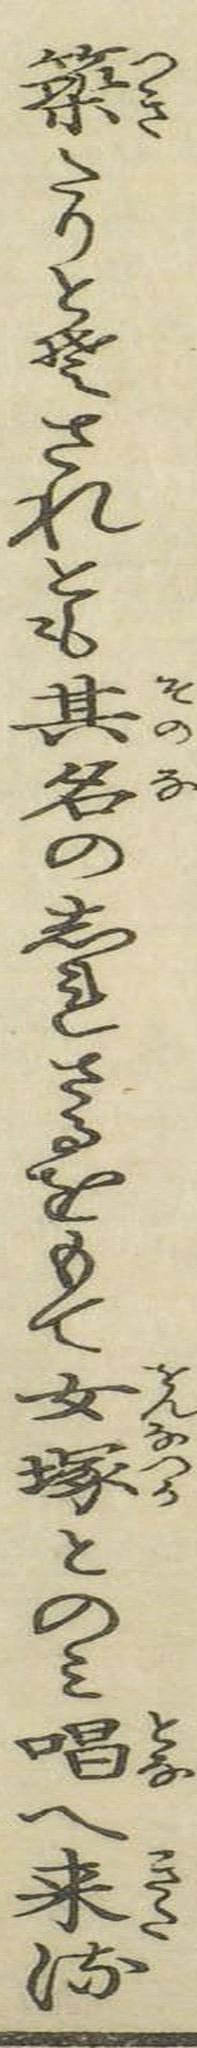築たりとそされとも其名のしれさるをもて女塚とのみ唱へ来る
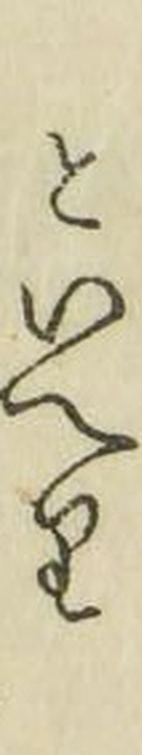といへり
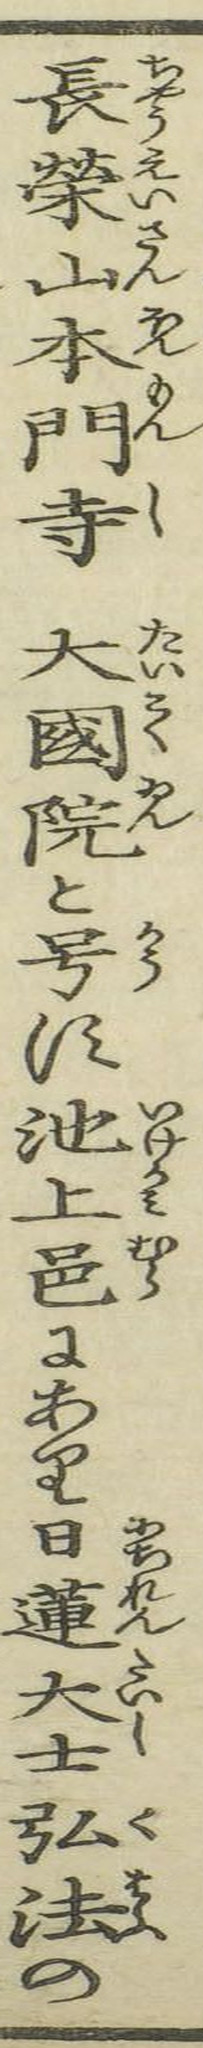長榮山本門寺大國院と号す池上邑にあり日蓮大士弘法の

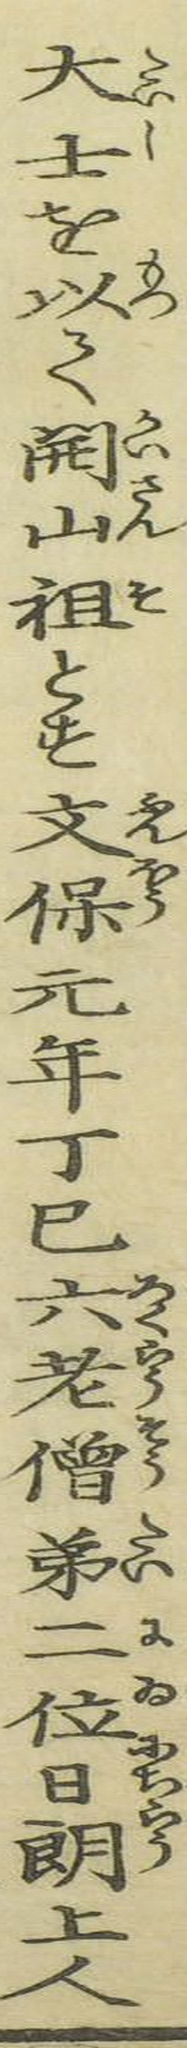大士を以て開山祖とす文保元年丁巳六老僧弟二位日朗上人
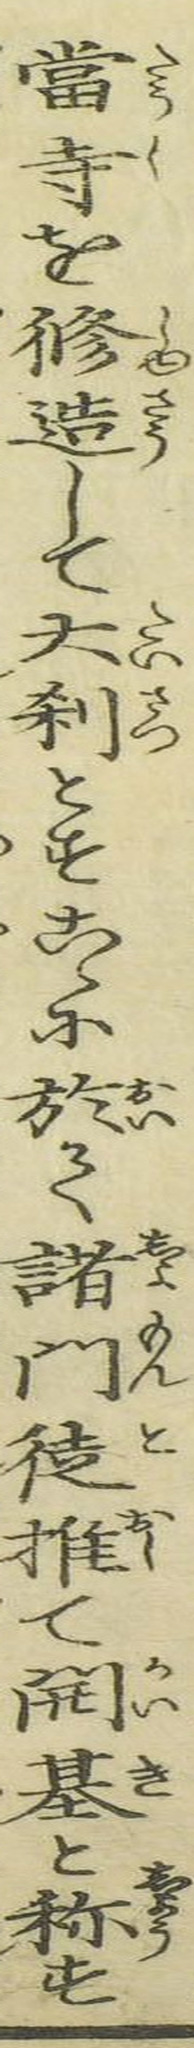當寺を修造して大刹とすこゝに於て諸門徒推て開基と称す

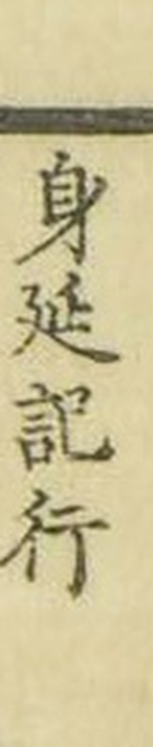身延記行
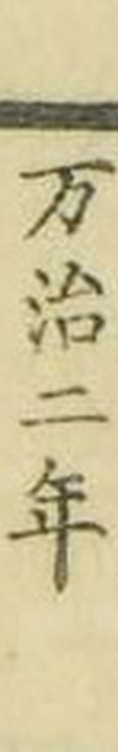万治二年
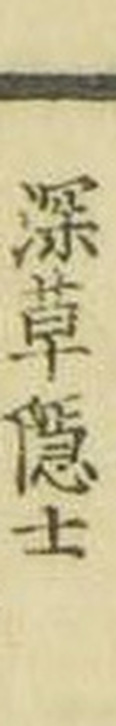深草隱士
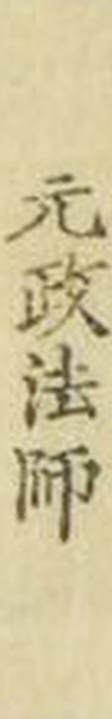元政法師
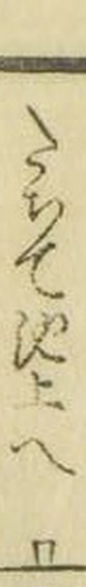たちて池上へ
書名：江戸名所図会 20巻 巻之4
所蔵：東京学芸大学教育コンテンツアーカイブ
